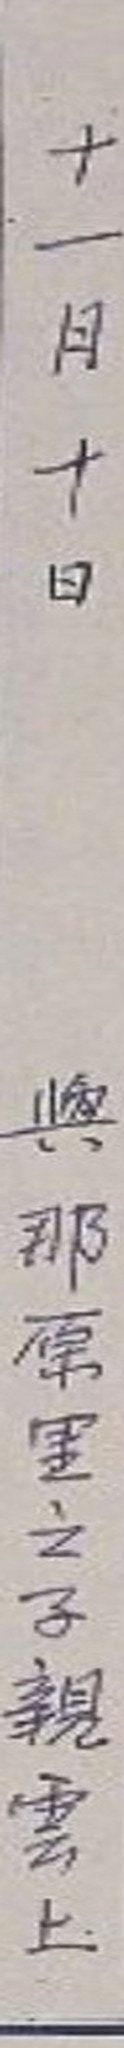十一月十日与那原里之子親雲上
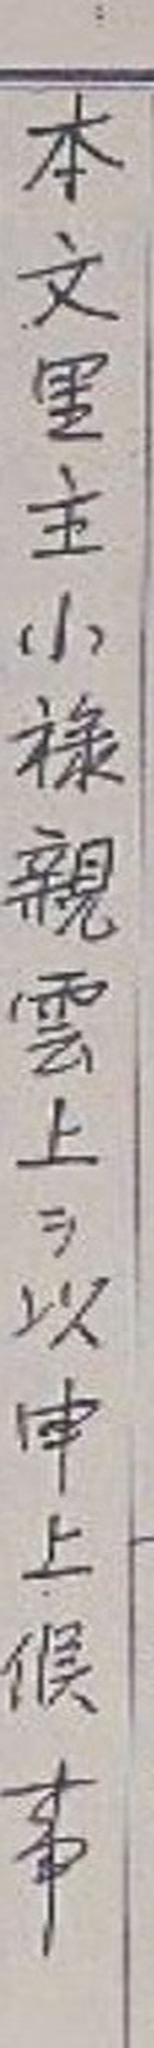本文里主小禄親雲上を以申上候事
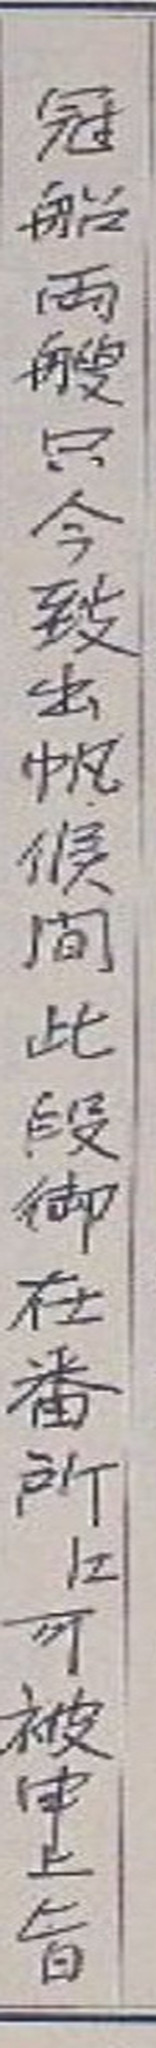冠船両艘只今致出帆候間此段御在番所え可被申上旨
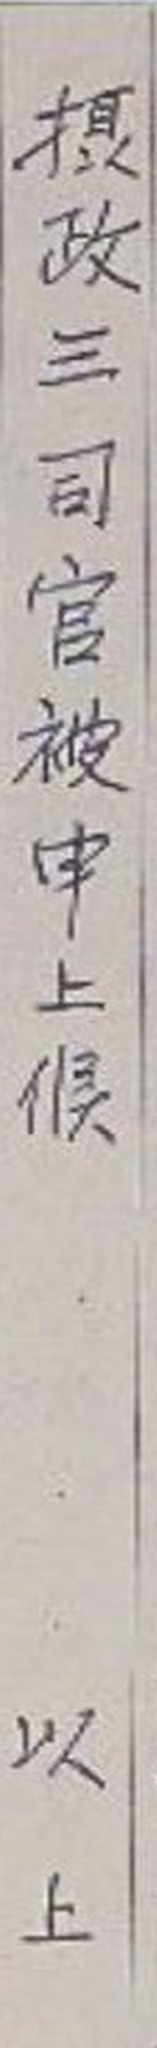摂政三司官被申付候以上
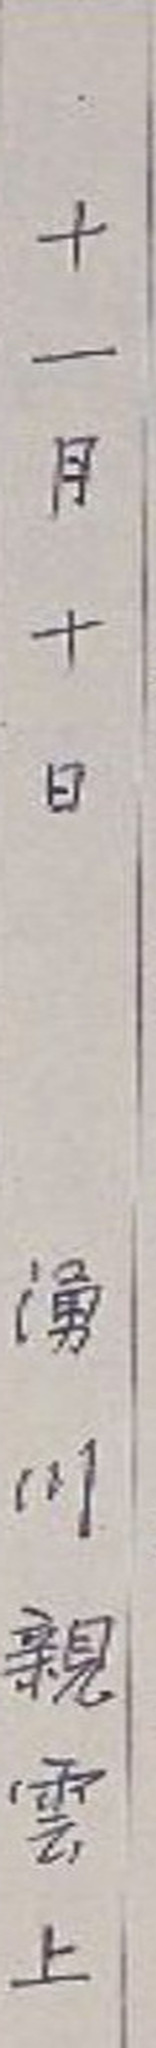十一月十日湧川親雲上
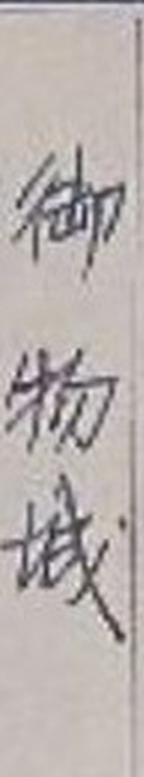御物城
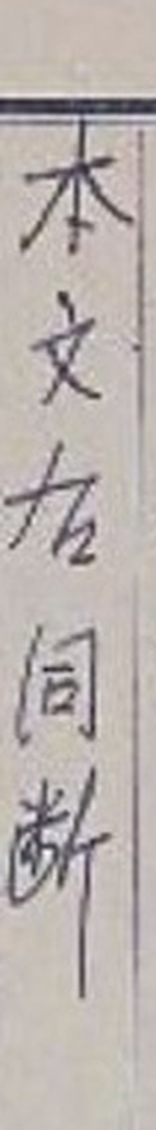本文右同断
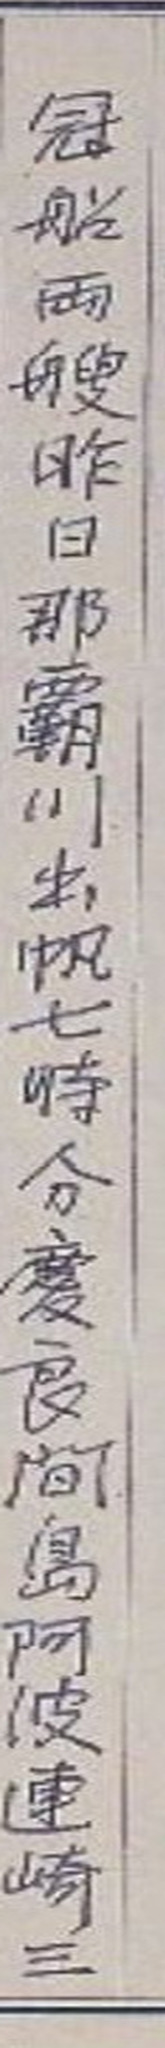冠船両艘昨日那覇川出帆七時分慶良間島阿波連崎三
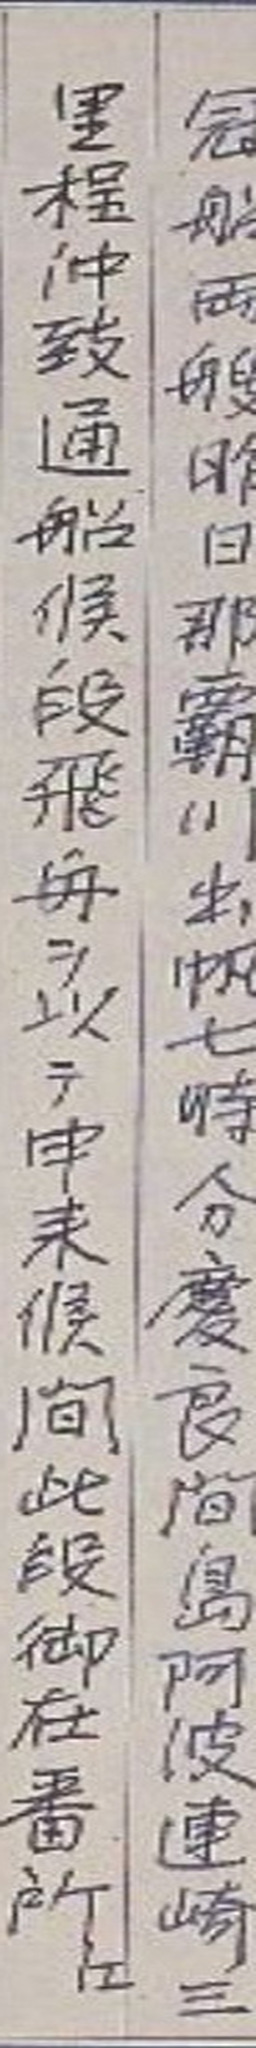里程沖致通船候段飛舟を以て申来候間此段御番所え
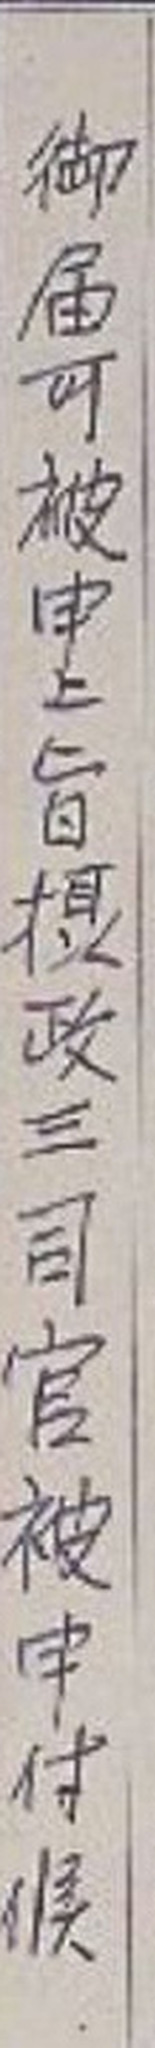御届可被申上旨摂政三司官被申付候以上
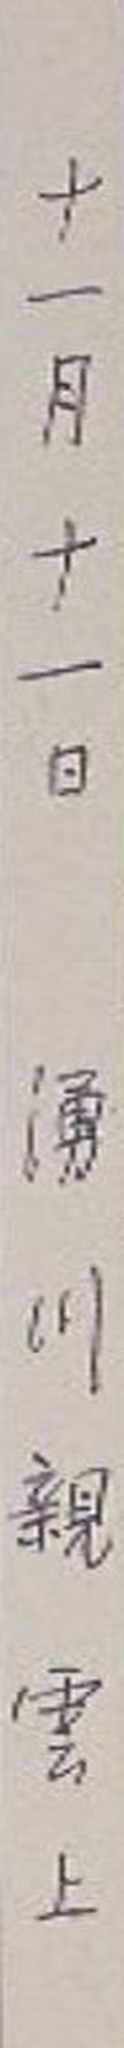十一月十一日湧川親雲上
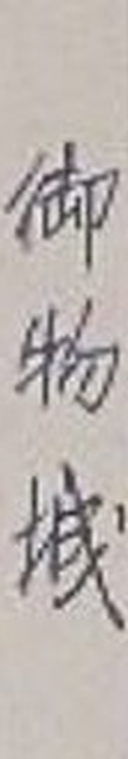御物城

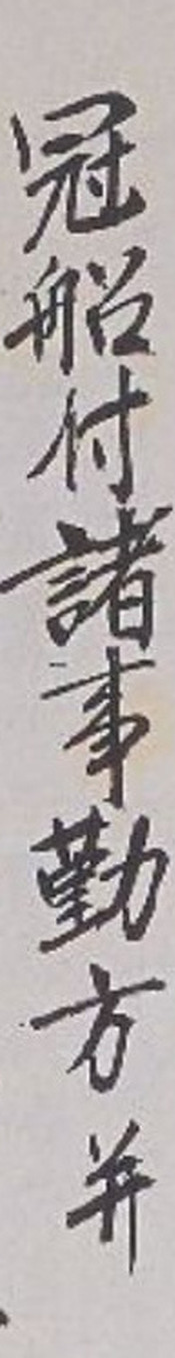冠船付諸事勤方并
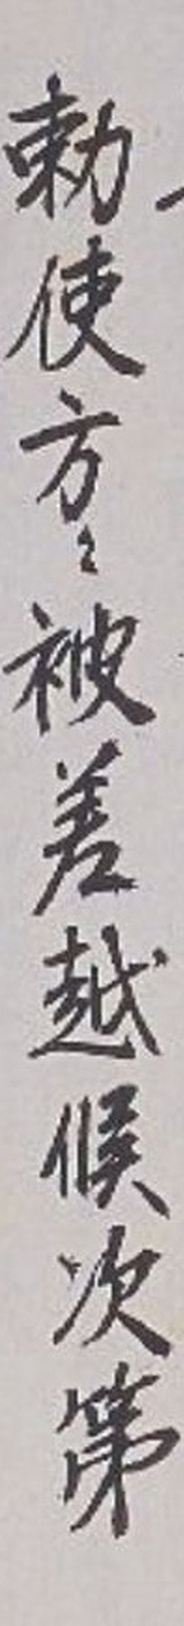勅使方々被差越候次第

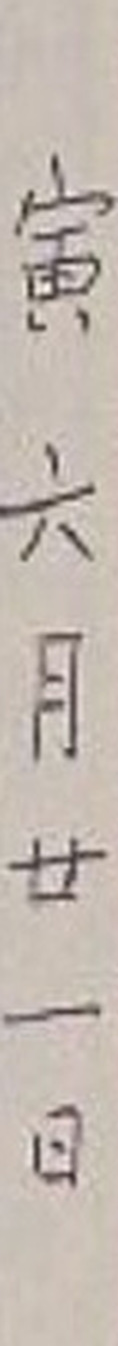寅六月廿一日
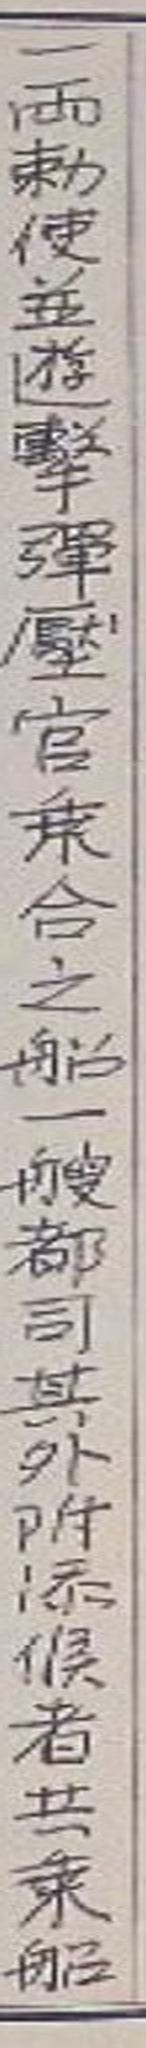一両勅使並遊撃弾圧官乗合之船一艘都司其外附添候者共乗船
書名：支那冊封使来琉諸記 下巻
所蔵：University of the Ryukyus Library
